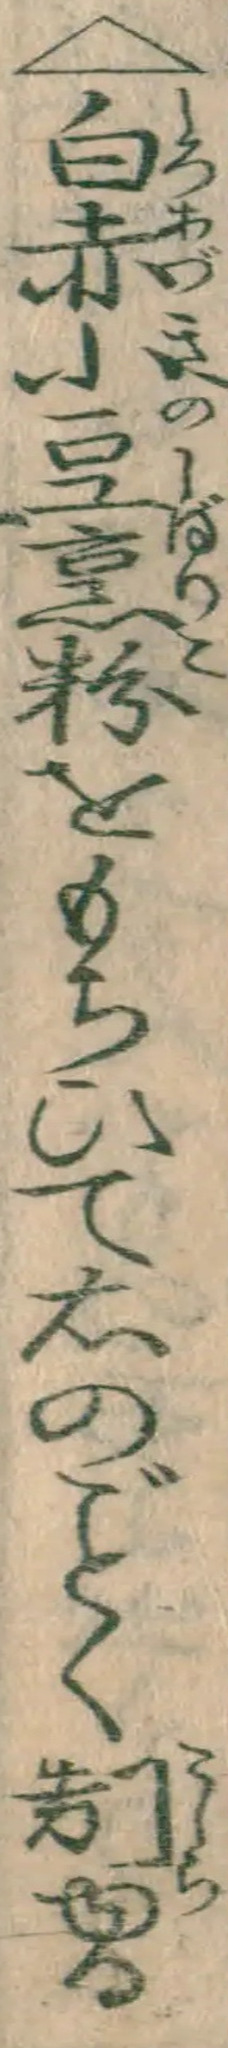△白赤小豆豆烹粉をもちひて右のごとく制ゆる
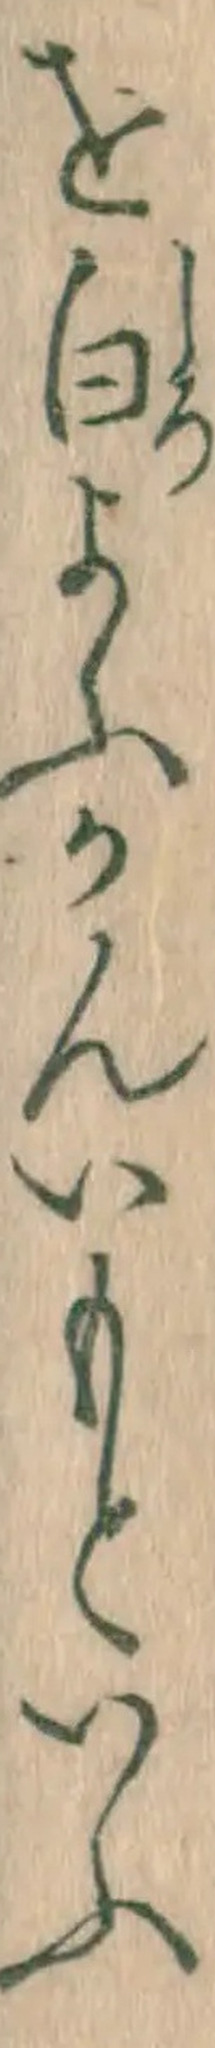を白よふかんいもといふ

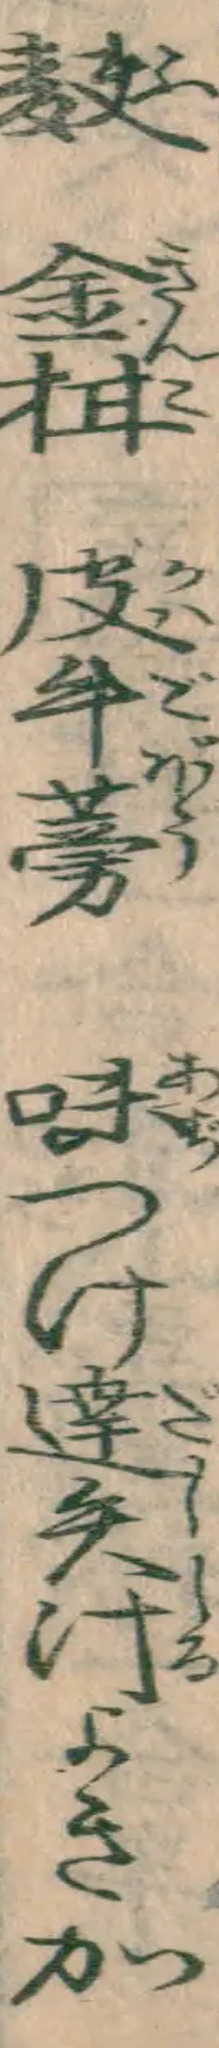麩金栮皮牛蒡味つけ達矢汁よきか
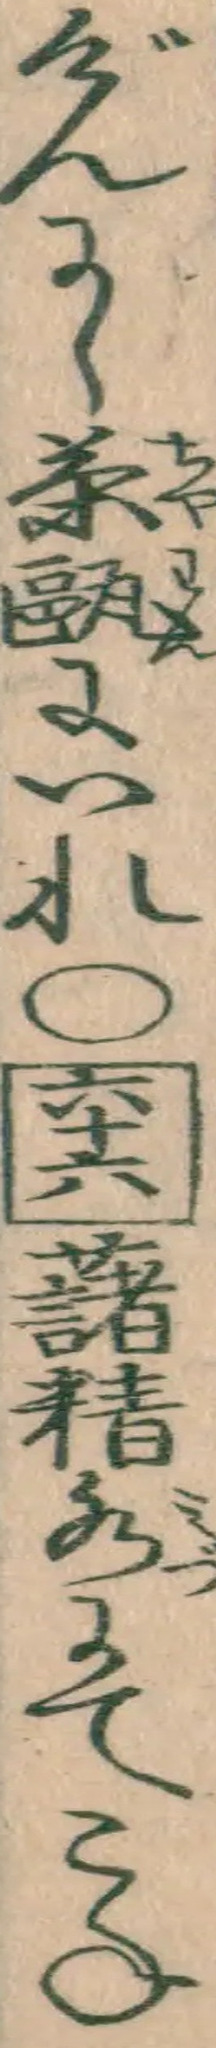げんにし茶甌にいれ○[六十六]藷精水にてこね
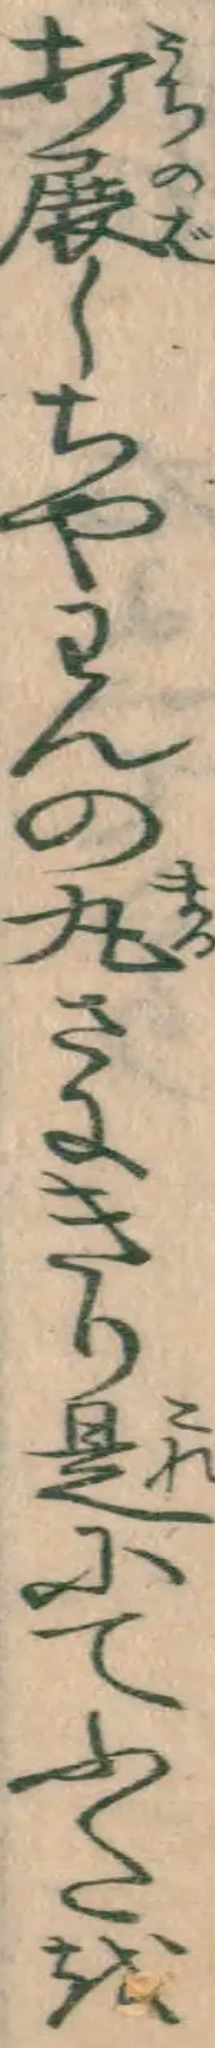打展しちやわんの丸さにきり是にてふたを
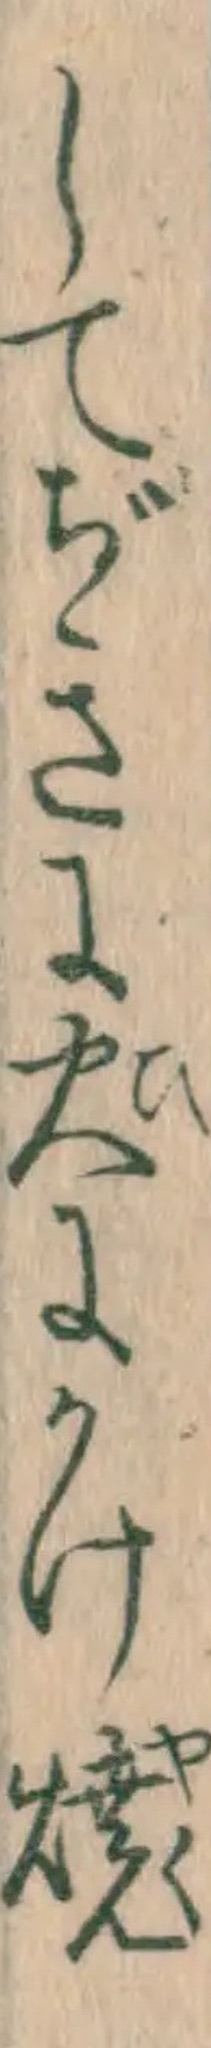してぢきに火にかけ焼
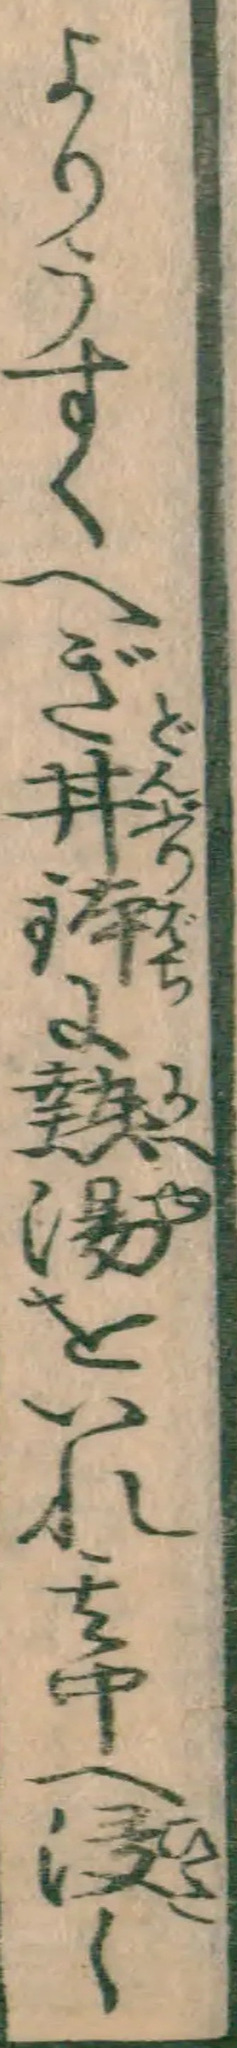よりうすくへぎ丼鉢に熱湯をいれ其中へ浸し
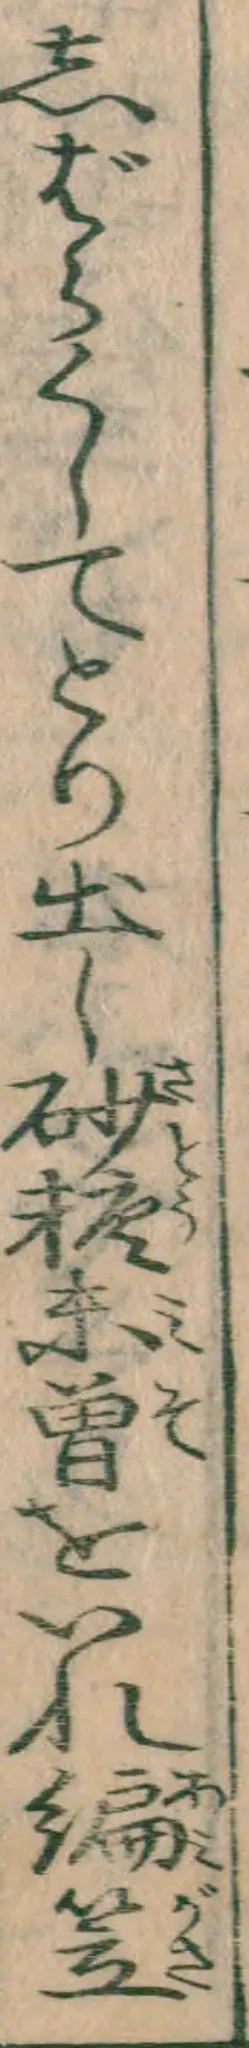しばらくしてとり出し砂糖味曽をいれ編笠
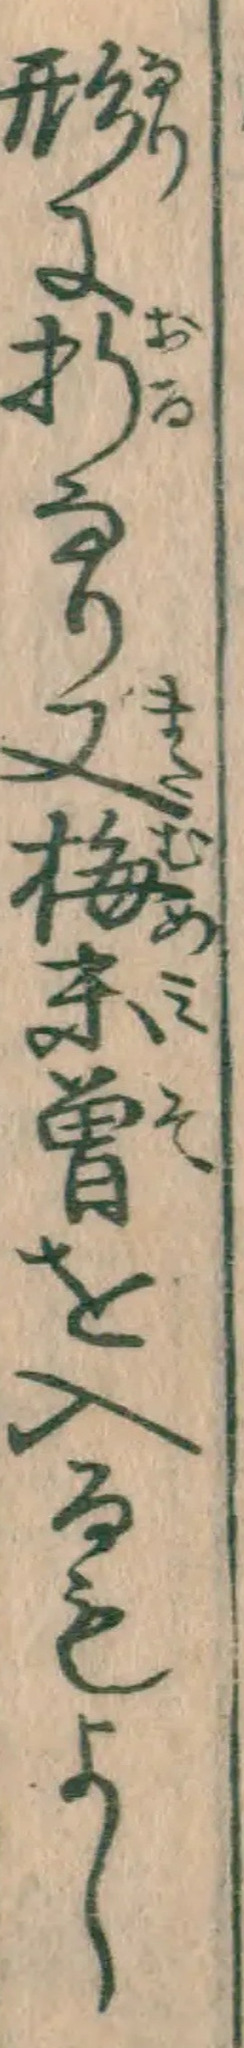形に折なり又梅味噌を入るもよし
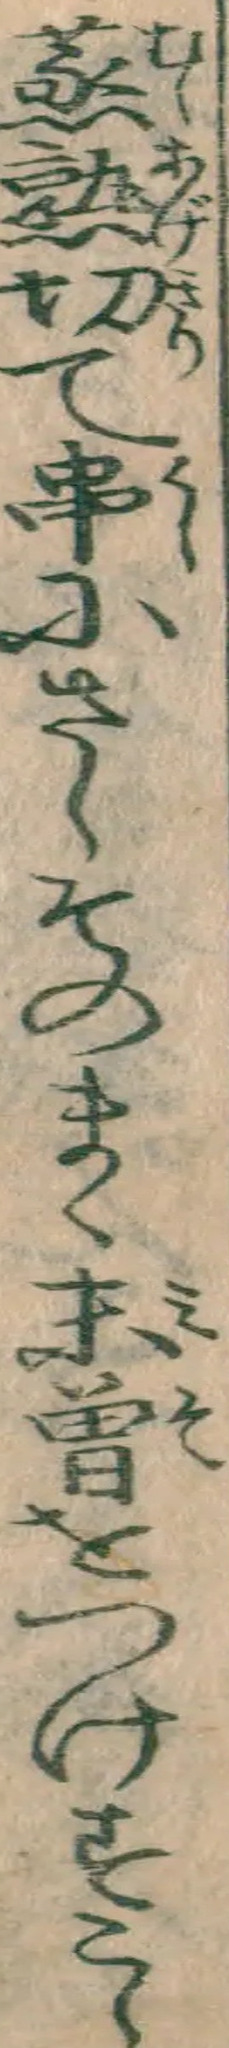蒸熟切て串にさしそのまゝ味曽をつけすこし
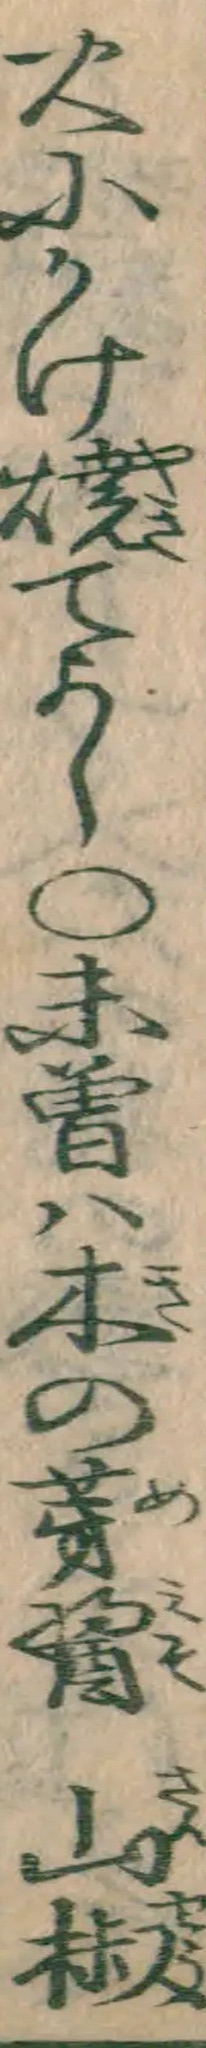火にかけて焼てよし○味曽は木の芽醤山椒
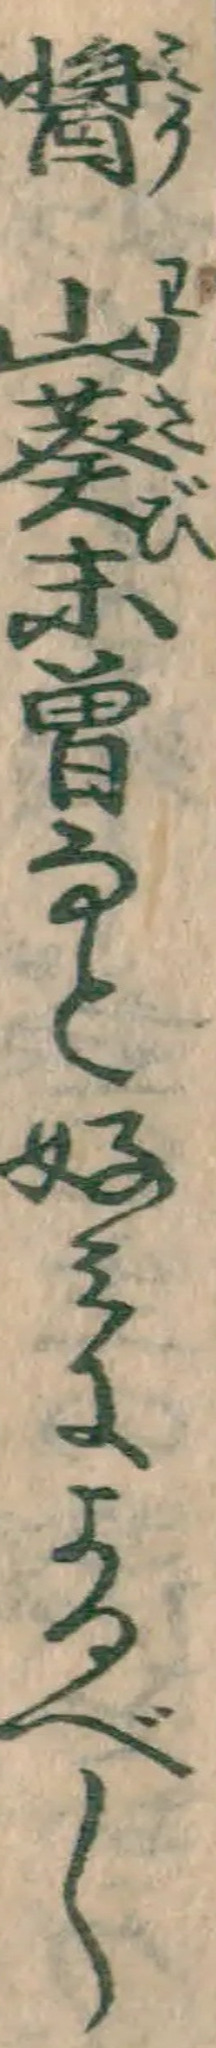醤山葵味曽なと好みによるべし

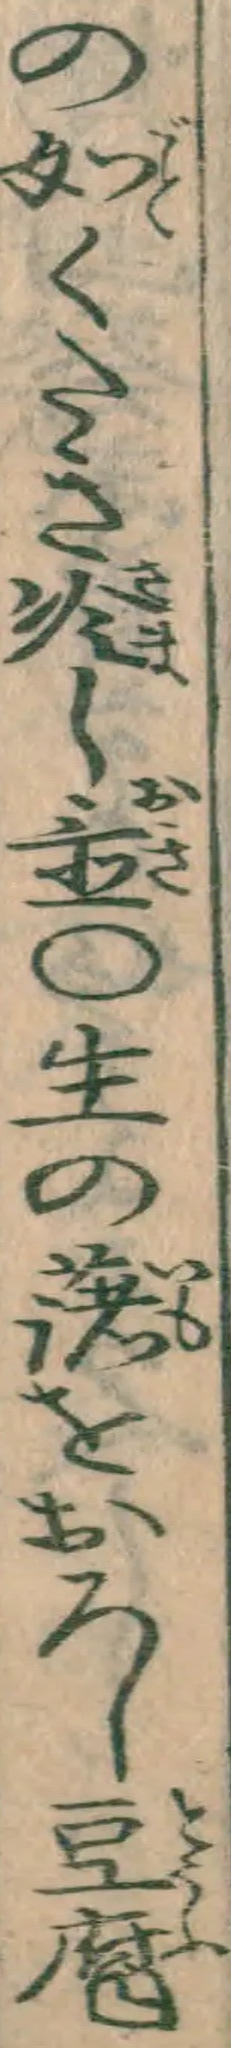の如くたき冷し置○生の藷をおろし豆腐
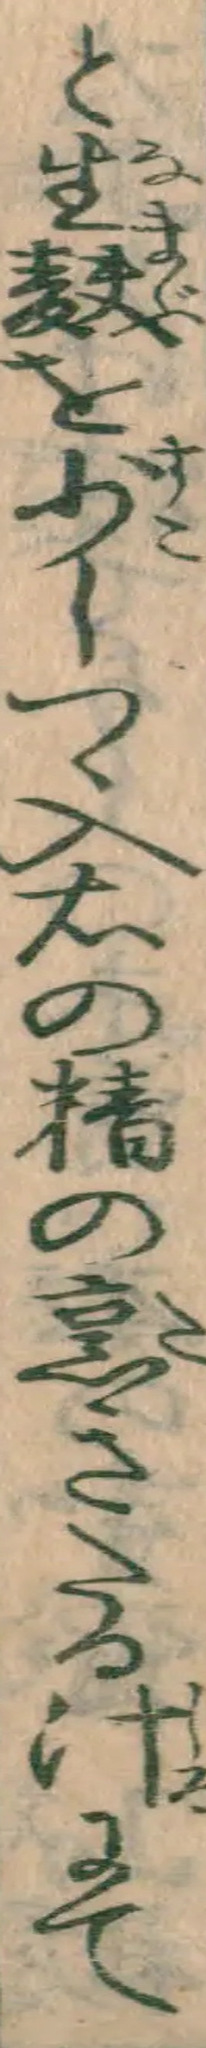と生麩を少しつゝ入右の精の烹きたる汁にて
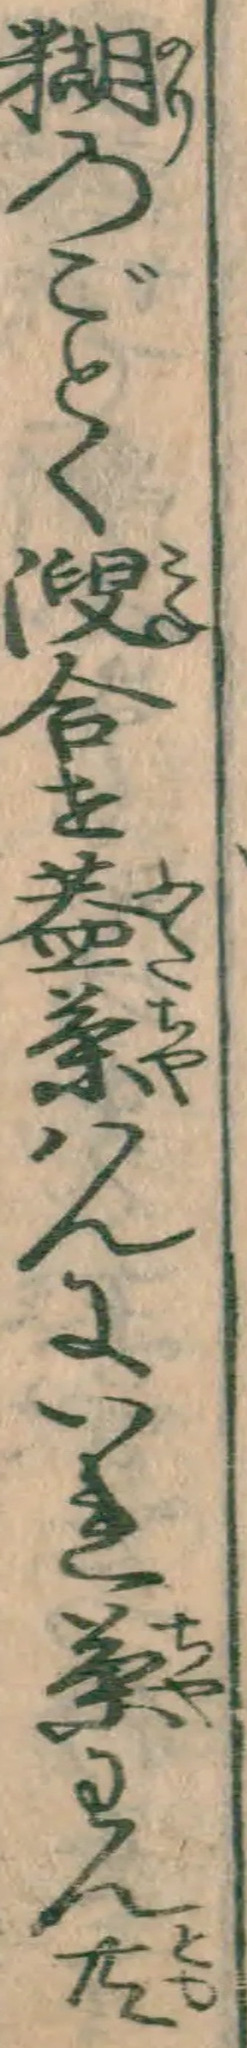糊のごとく溲合を蓋茶はんにいれ茶わん共
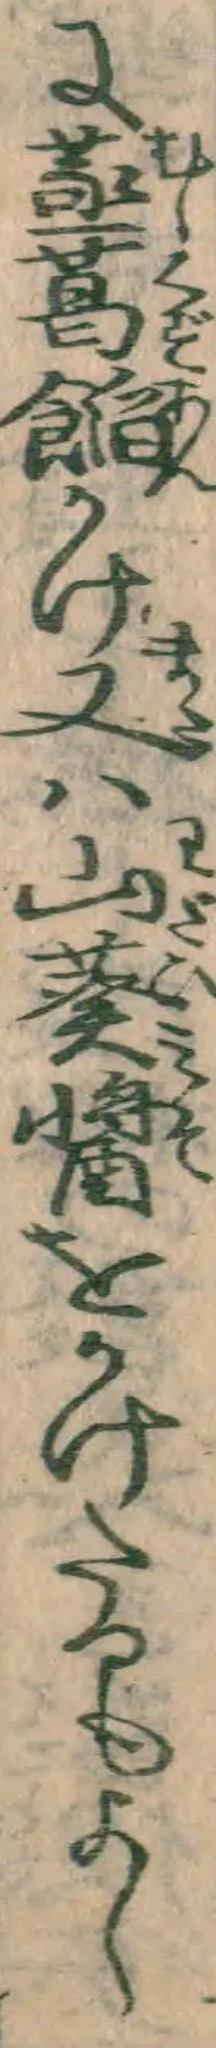に蒸葛餡かけ又は山葵醤をかけたるもよし
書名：甘藷百珍
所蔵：国立国会図書館 National Diet Library, JAPAN
